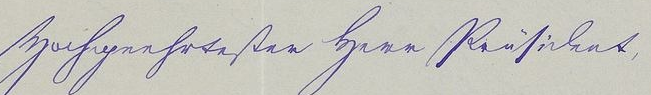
Hochgeehrtester Herr Präsident,
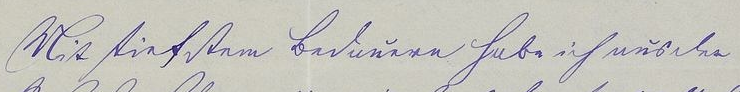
Mit tiefstem Bedauern habe ich aus der
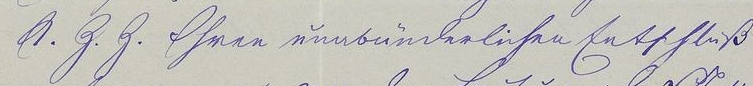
N.Z.Z. Ihren unabänderlichen Entschluß
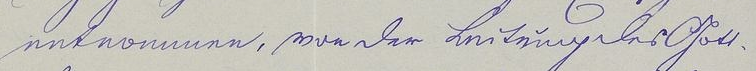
entnommen, von der Leitung des Gott-
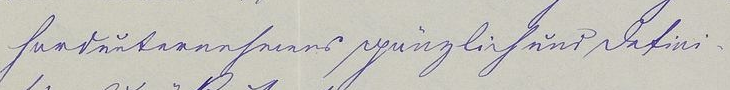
hardunternehmens gänzlich und defini-
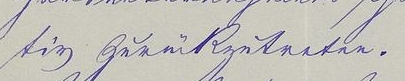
tiv zurückzutreten.
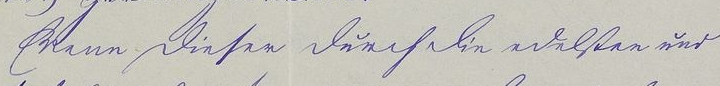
Wenn dieser durch die edelsten und
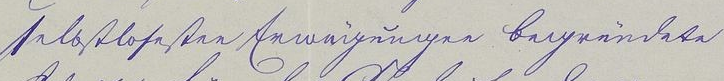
selbstlosesten Erwägungen begründete
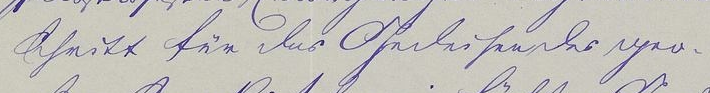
Schritt für das Gedeihen des gro-
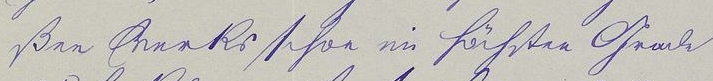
ßen Werks schon im höchsten Grade
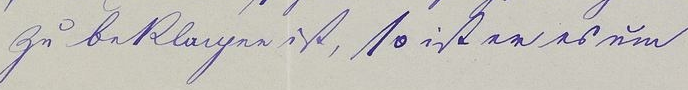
zu beklagen ist, so ist er es um
